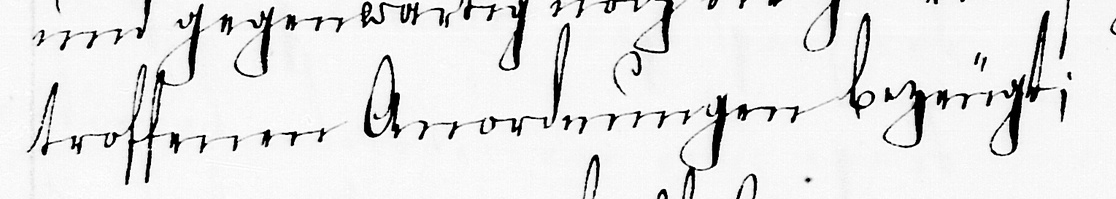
troffenen Anordnungen bezeugt;
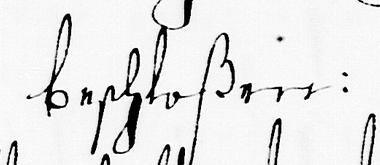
beschloßen:
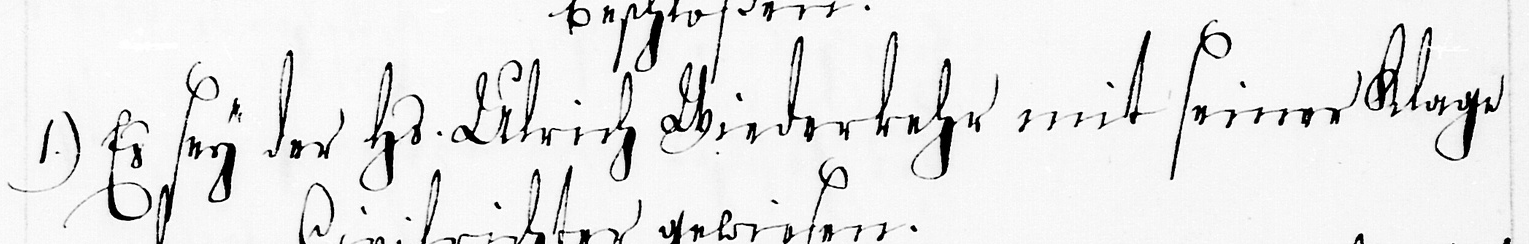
Es sey der Hs. Ulrich Wiederkehr mit seiner Klage
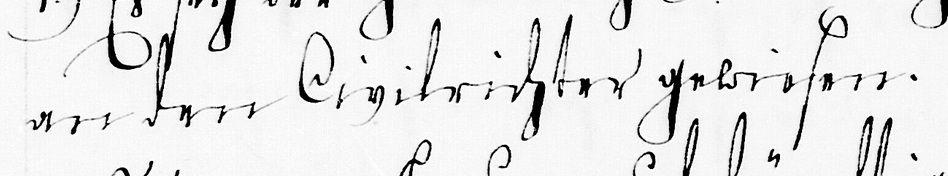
an den Civilrichter gewiesen.
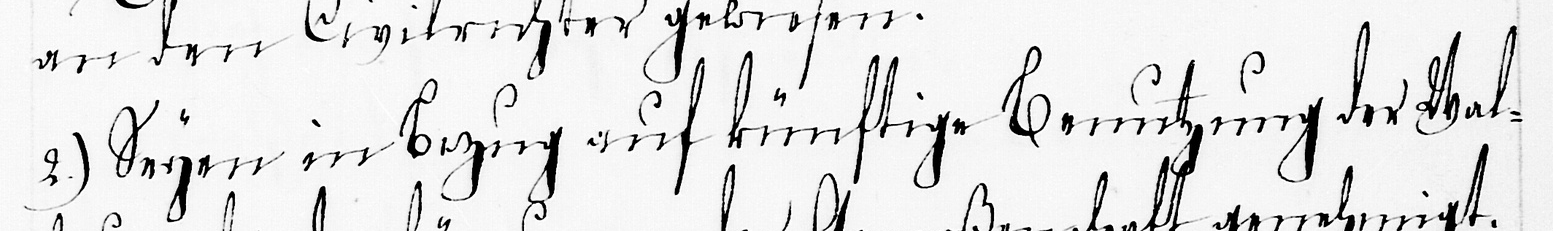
2.) Seyen in Bezug auf künftige Benutzung der Wal¬
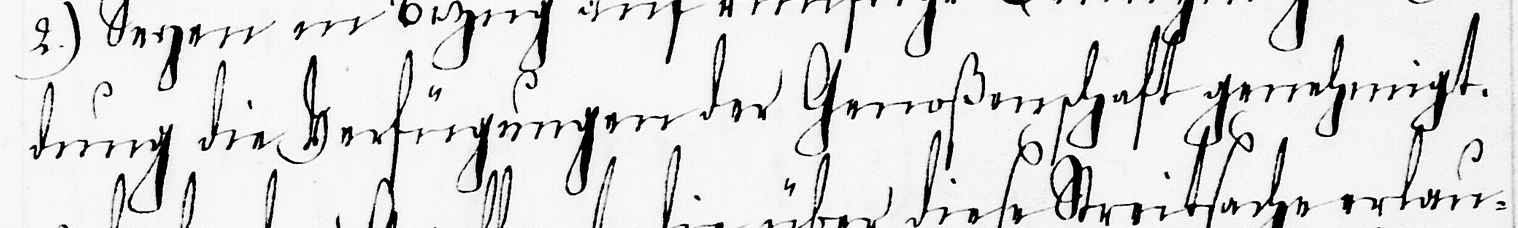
dung die Verfügungen der Genoßenschaft genehmigt.
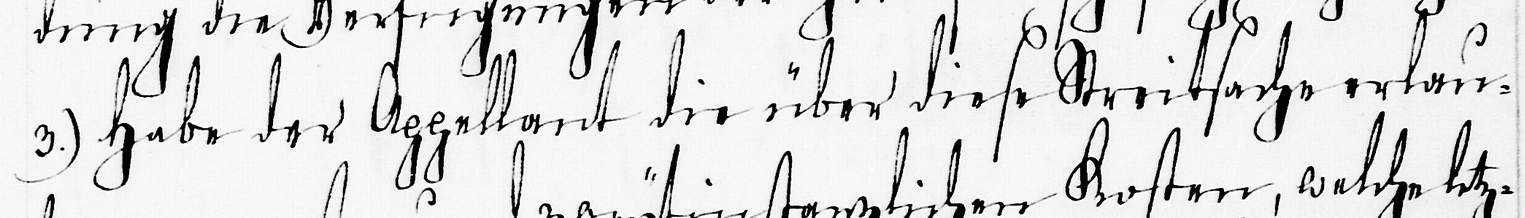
3.) Habe der Appellant die über diese Streitsache erlau¬
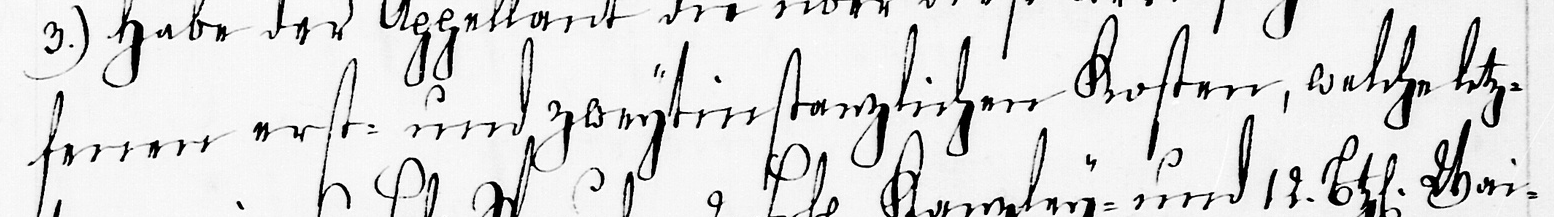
fenen erst- und zweytinstanzlichen Kosten, welche le¬
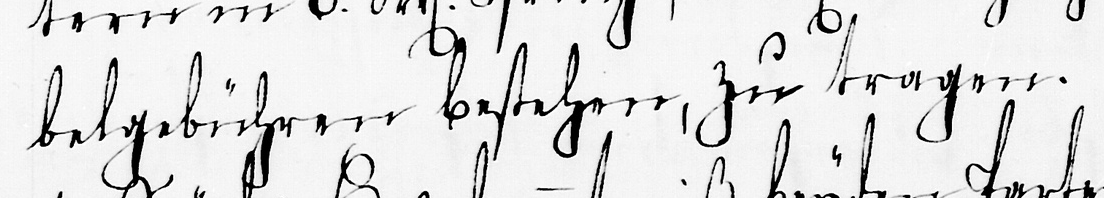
belgebühren bestehen, zu tragen.
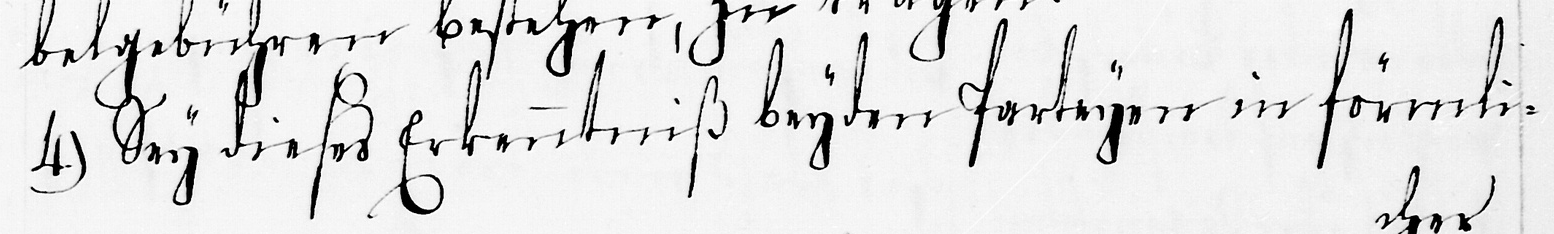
4.) Sey dieses Erkenntniß bey den Parteyen in förmli-
